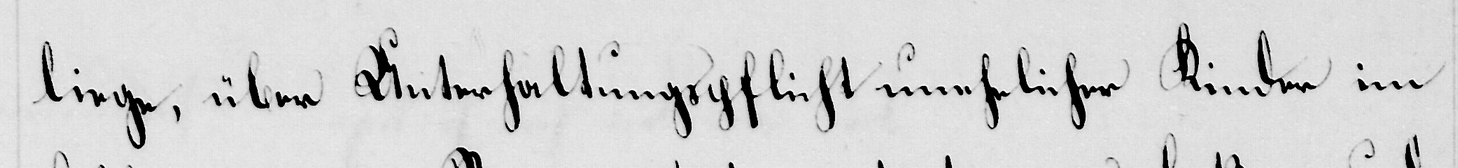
liege, über Unterhaltungspflicht unehelicher Kinder im
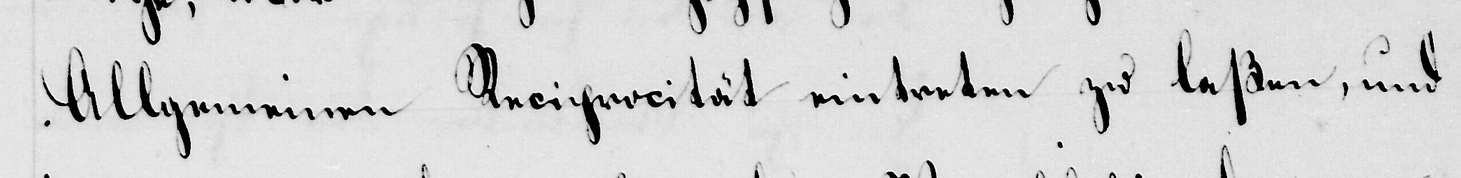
Allgemeinen Reciprocität eintreten zu laßen, und
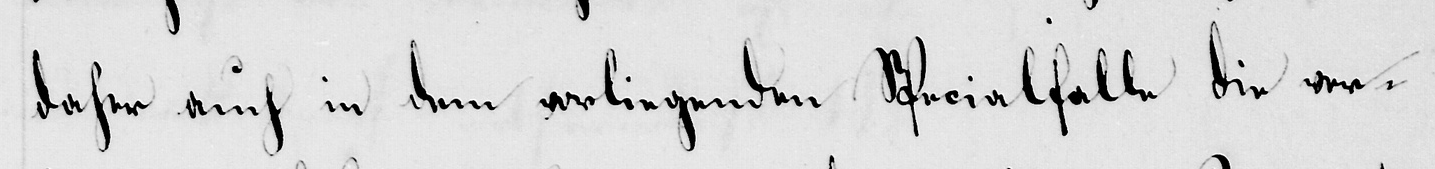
daher auch in dem vorliegenden Specialfalle die ver¬
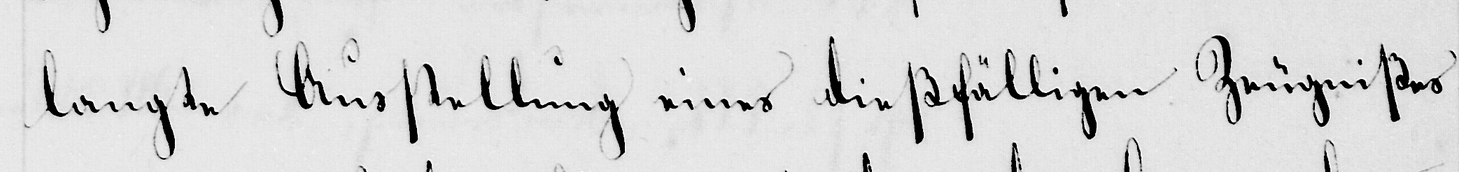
langte Ausstellung eines dießfälligen Zeugnißes
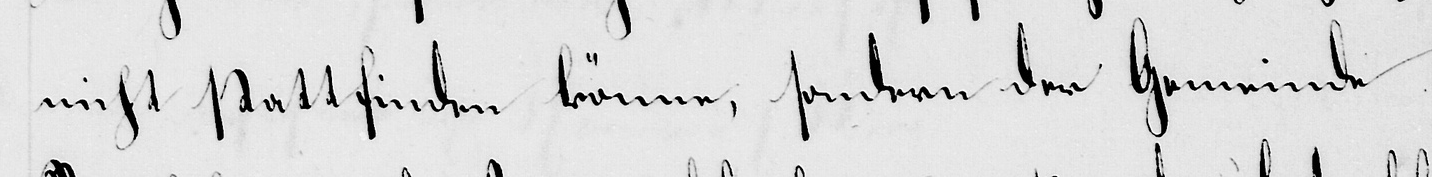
nicht stattfinden könne, sondern der Gemeinde
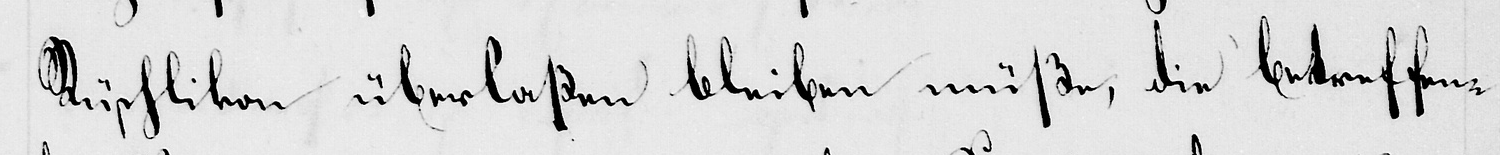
Rüschlikon überlaßen bleiben müße, die betreffen¬
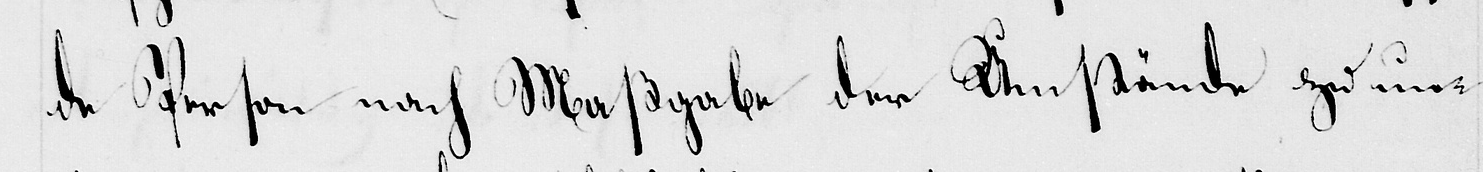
de Person nach Maßgabe der Umstände zu un¬
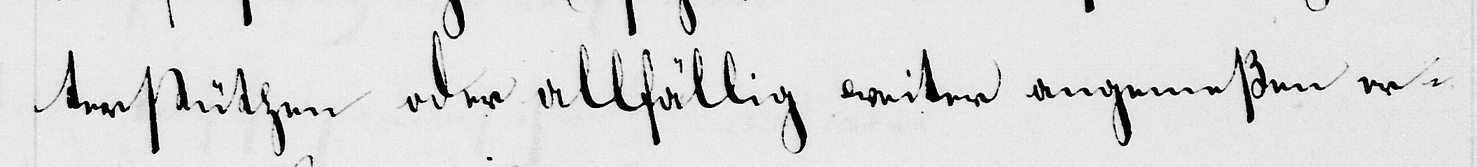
terstützen oder allfällig weiter angemeßen er¬
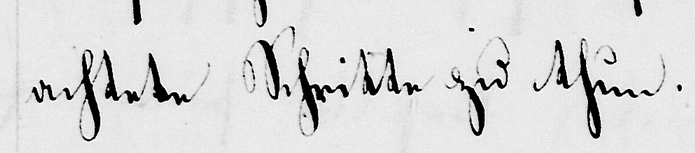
achtete Schritte zu thun.
